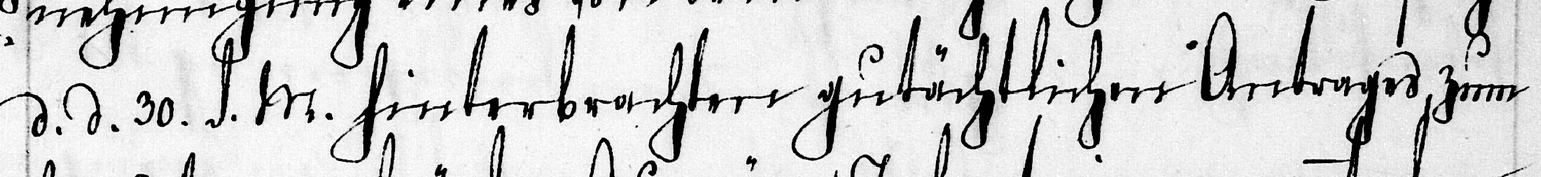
d. d. 30. d. M. hinterbrachten gutächtlichen Antrages, zum
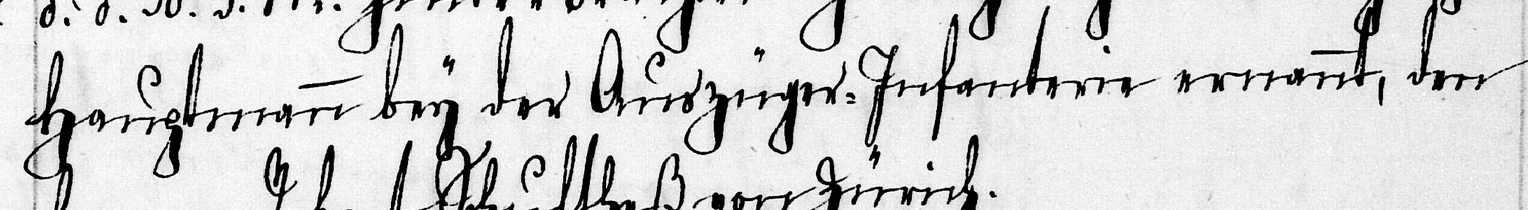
Hauptmann bey der Auszüger-Infanterie ernannt, den
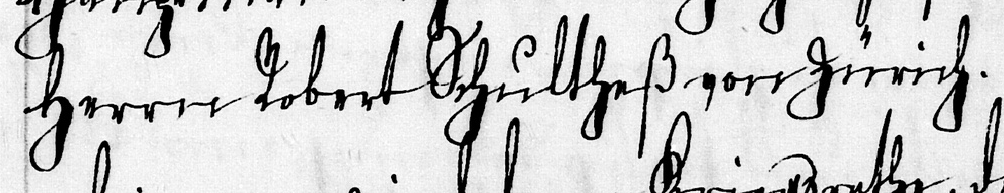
Herrn Robert Schultheß von Zürich.
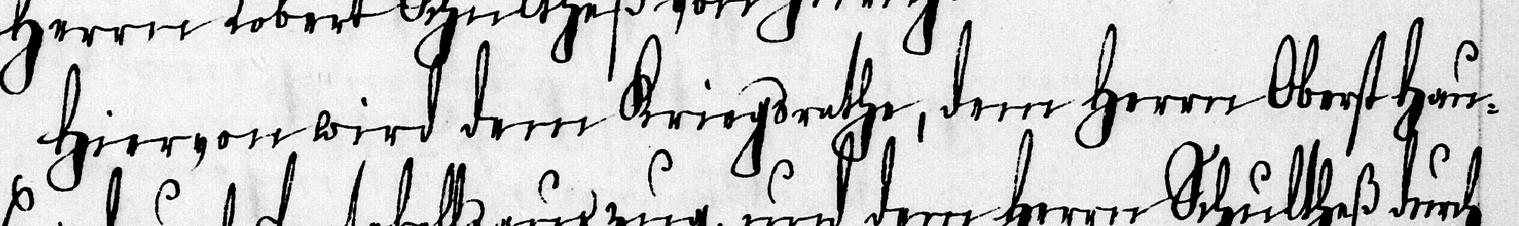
Hiervon wird dem Kriegsrathe, dem Herrn Oberst Hau¬
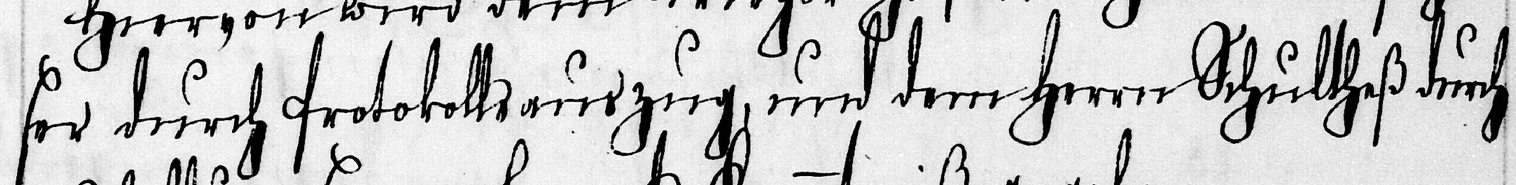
ser durch Protokollsauszug, und dem Herrn Schultheß dur¬
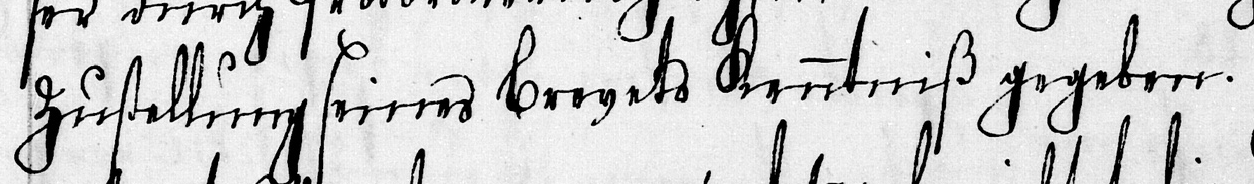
Zustellung seines Brevets Kenntniß gegeben.
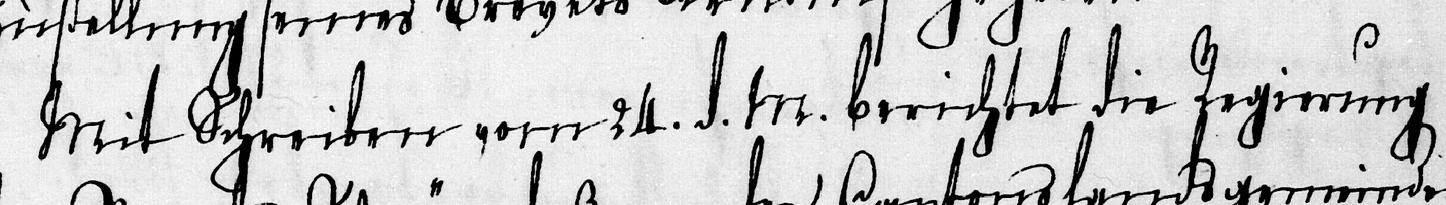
Mit Schreiben vom 24. d. M. berichtet die Regierung
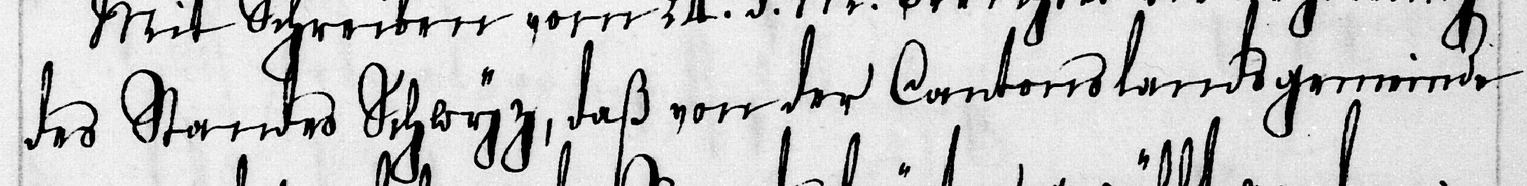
des Standes Schwyz, daß von der Cantonslandsgemeinde
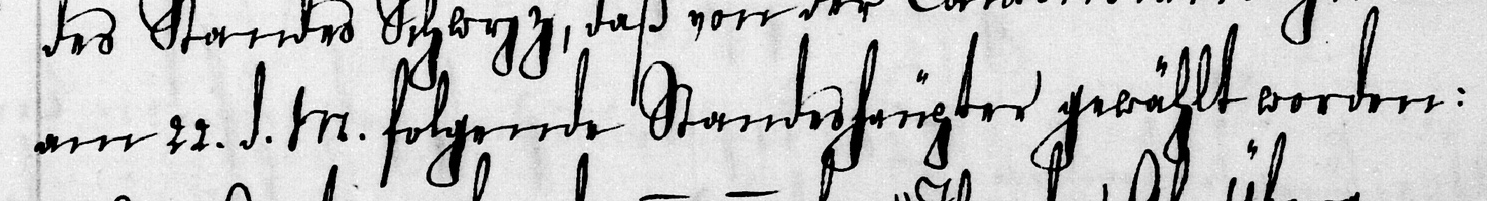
am 22. d. M. folgende Standeshäupter gewählt worden:
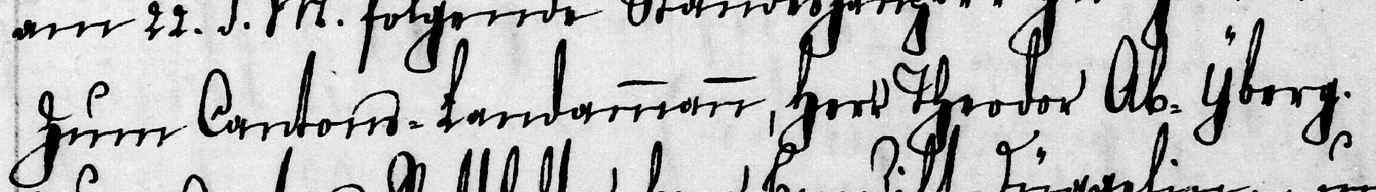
Zum Cantons-Landammann, Herr Theodor Ab-Yberg.
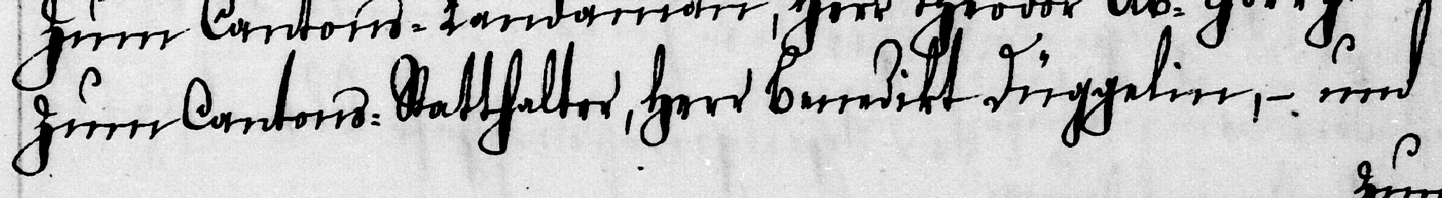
Zum Cantons Statthalter, Herr Benedikt Düggelin, – und
